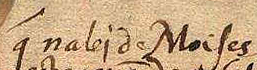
q̄ na lej de Moises
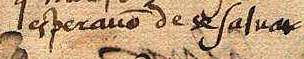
esperauō de se saluar
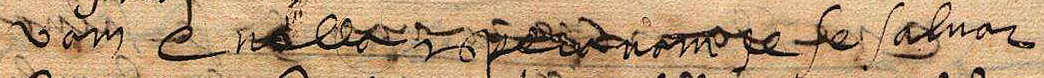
vam e nella esperauam de se saluar
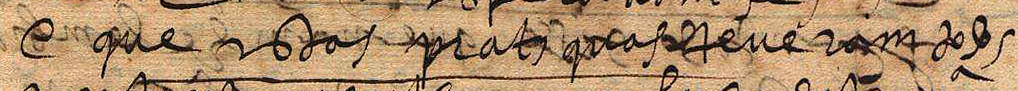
e que estas pratiquas teueram todos
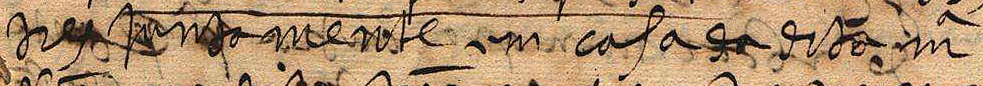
tres Juntamente em casa da dita ma
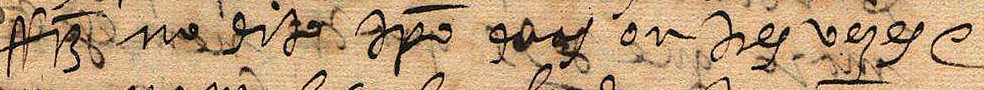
ffr̄z no dito tpō duas ou tres vezes e
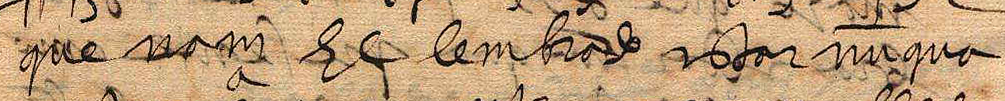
que nam he lembrado estar nūqua
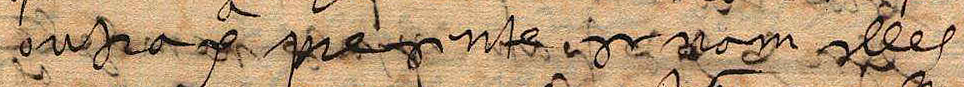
outra pa presente senam elles
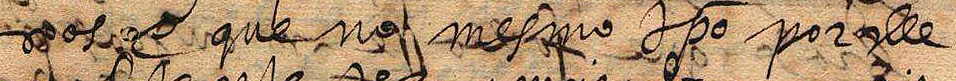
soos e que no mesmo tpō por elle
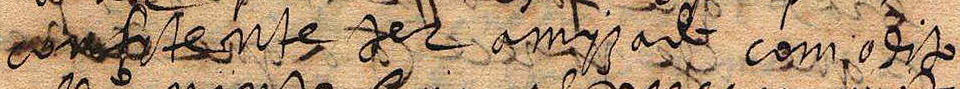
confitente ter amyzade com o dito
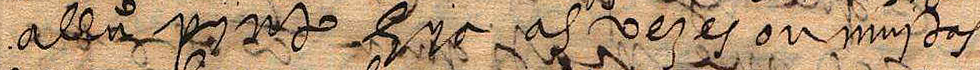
alluo pynto hya as vezes ou mujtas
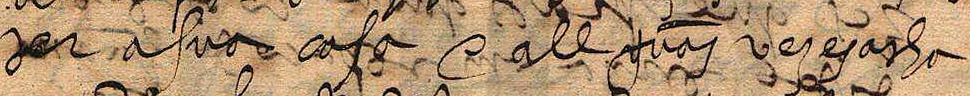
ter a sua casa e allgūas vezes acha
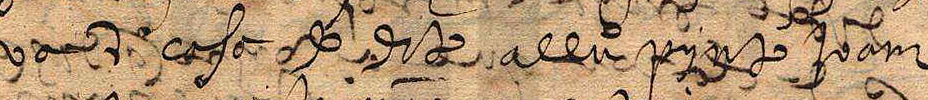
va ē casa do dito alluo pynto Joam
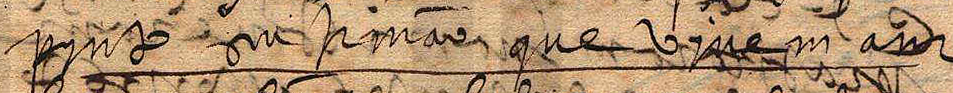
pynto seu Jrmão que vjuem am
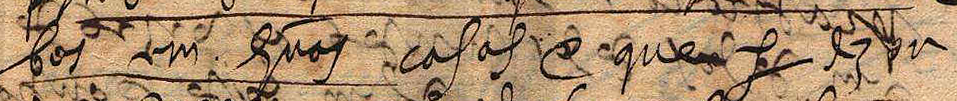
bos em hūas casas e que ꝑ dez ou
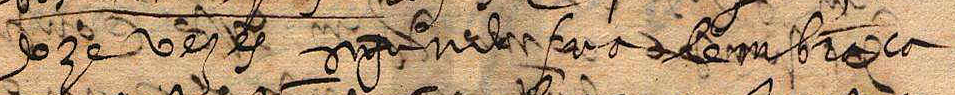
doze vezes segundo sua lembrāça
